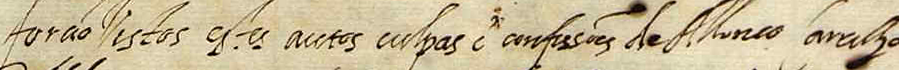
foraõ Vistos estes autos culpas e confissões de Alonço Carrilho
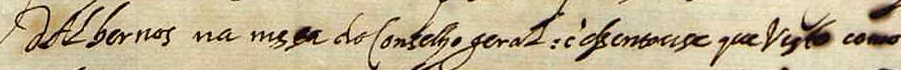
dAlbernos na messa do Conselho geral: e assentouse que Visto como
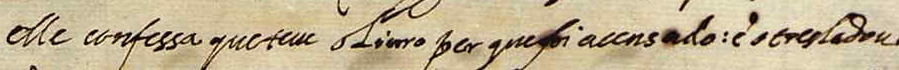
elle confessa que teue o Liuro per que foi accusado: e o tresladou
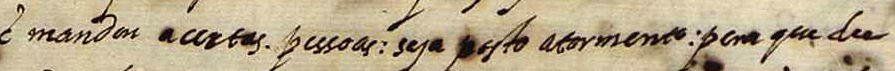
e mandou a certas pessoas: seja posto a tormento: pera que dee
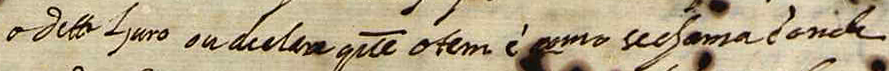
o ditto Ljuro ou declare quē o tem e como se chama e onde
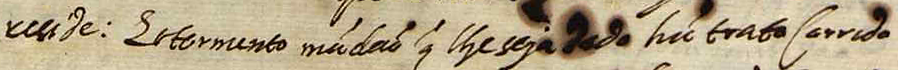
reside: E o tormento mādaõ q̄ lhe seja dado hū trato Corrido
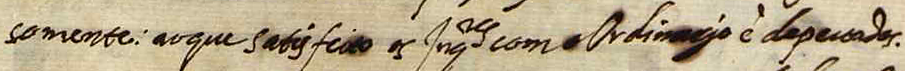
somente: ao que satisfeito os Jnqres com o Ordinario e deputados.
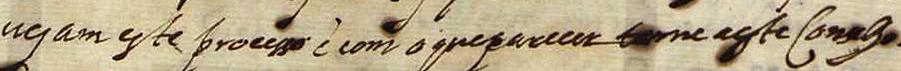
uejam este processo e com o que parecer torne a este Conselho.
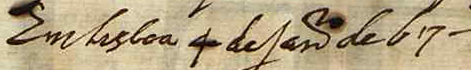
Em lisboa 4 de Janro de 617
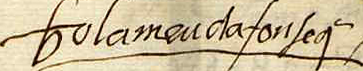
b̄olameu da fonseqa
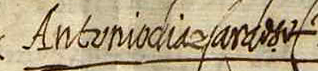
Antonio diaz Cardozo
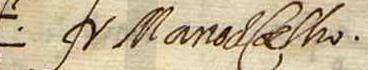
fr Manoel Coelho.
